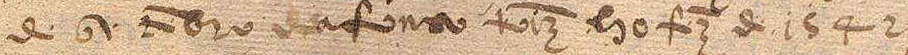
de setēbro d afonso Rōiz ho fez de i542
